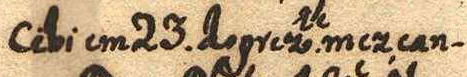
cibi em 23. do prez.te mez, e an
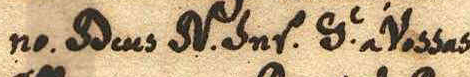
no. Deus N. Snr.o G.e a Vossas
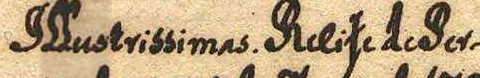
Illustrissimas. ReCife de Per
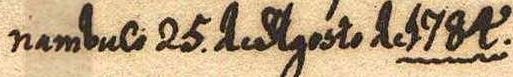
nambuco 25. de Agosto de 1784.
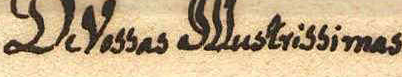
De Vossas Illustrissimas.
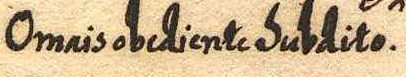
O mais obediente Subdito.
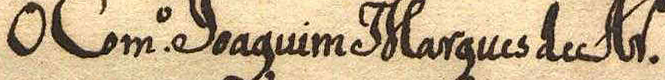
O Com.o Ioaquim Marques de Ar.o
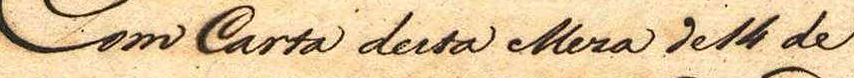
Com Carta desta Meza de 14 de
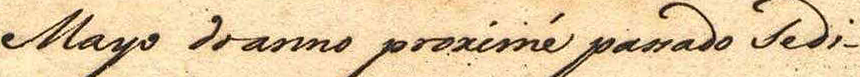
Mayo do anno proximé passado se di
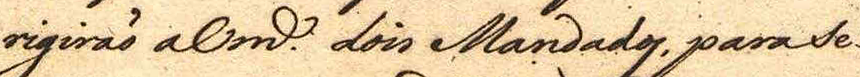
rigiraõ a Vm.e dois Mandados, para se
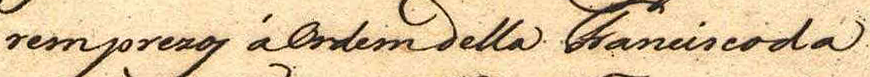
rem prezos á Ordem della Francisco da
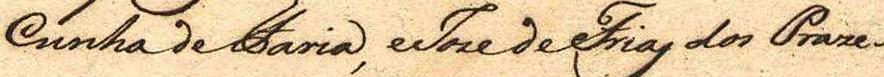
Cunha de Faria, e Iose de Frias dos Praze
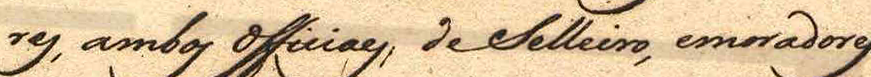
res, ambos Officiaes, de Selleiro, e moradores
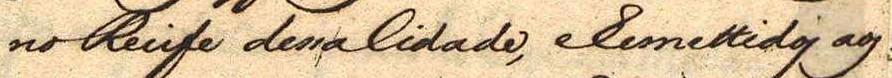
no Recife dessa Cidade, e Remettidos aos
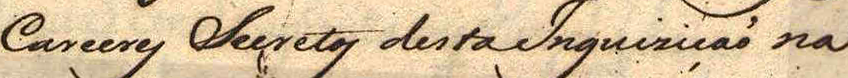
Carceres Secretos desta Inquiziçaõ na
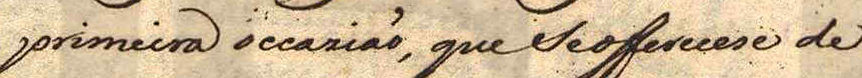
primeira occaziaõ, que Se offerecese de
